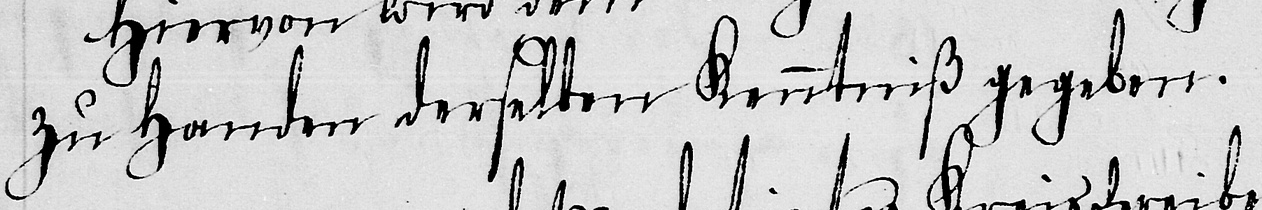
zu Handen derselben Kenntniß gegeben.
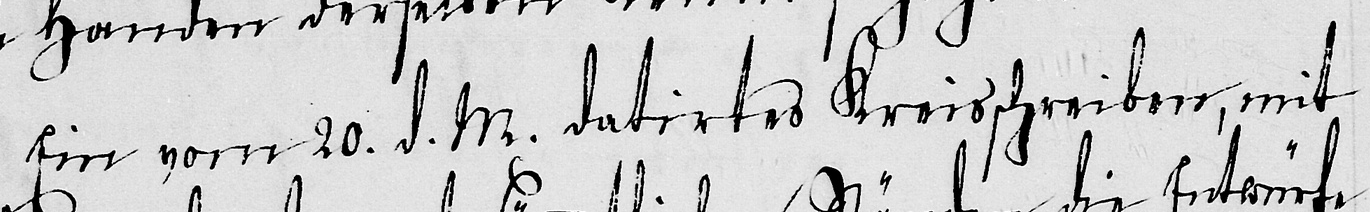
Ein vom 20. d. M. datirtes Kreisschreiben, mit
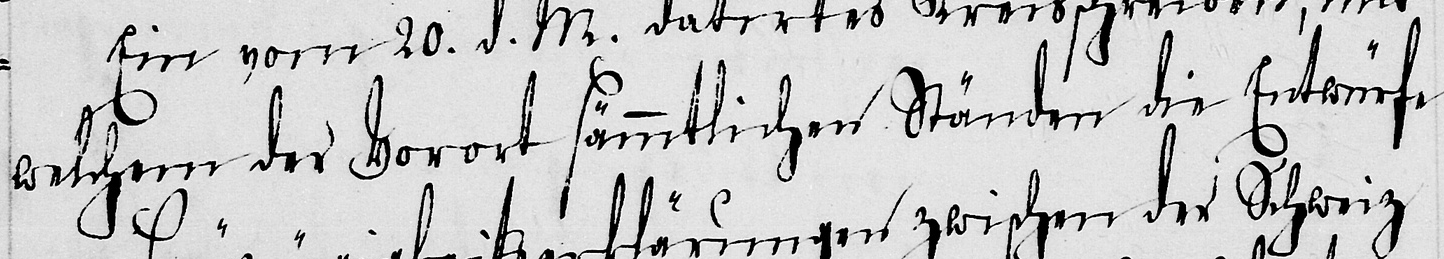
welchem der Vorort sämmtlichen Ständen die Entwürfe
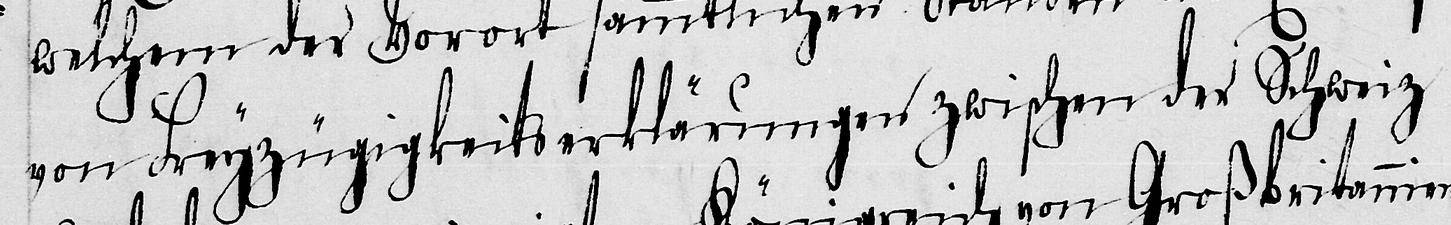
von Freyzügigkeitserklärungen zwischen der Schweiz
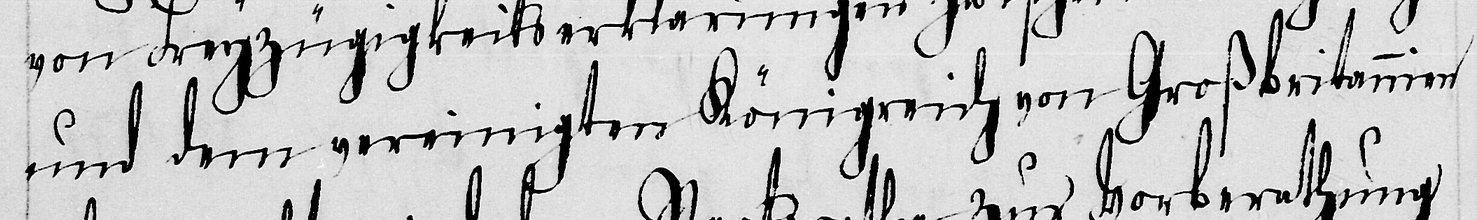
und dem vereinigten Königreich von Großbritann¬
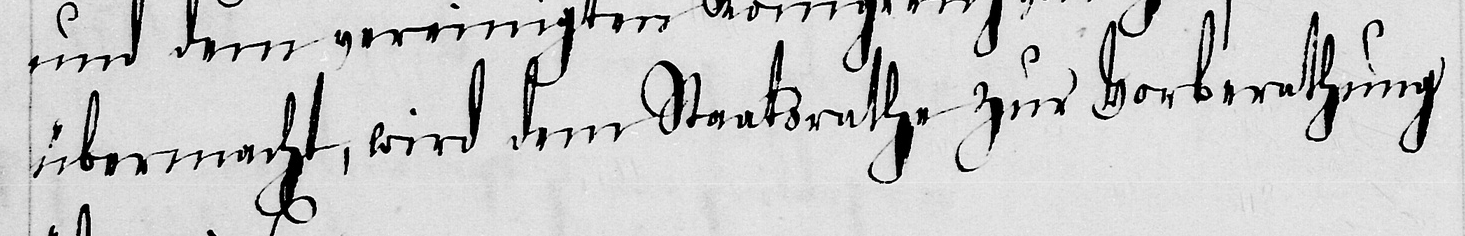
übermacht, wird dem Staatsrathe zur Vorberathung
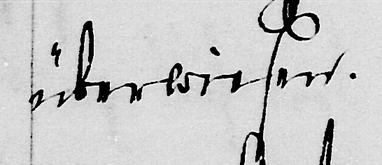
überwiesen.
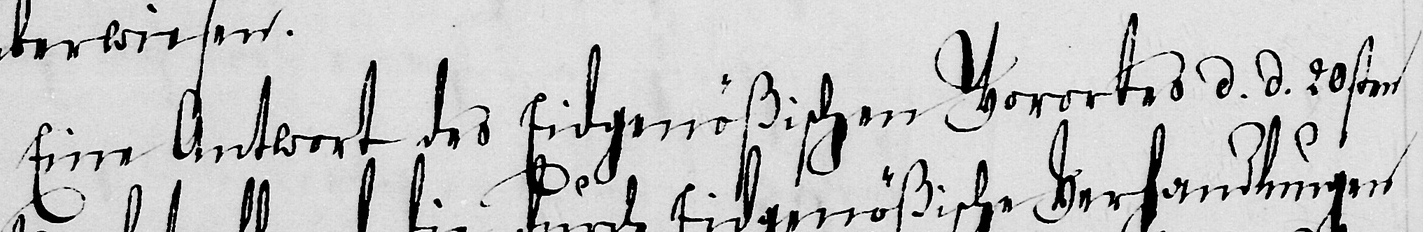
Eine Antwort des Eidgenößischen Vorortes d.d. 20sten
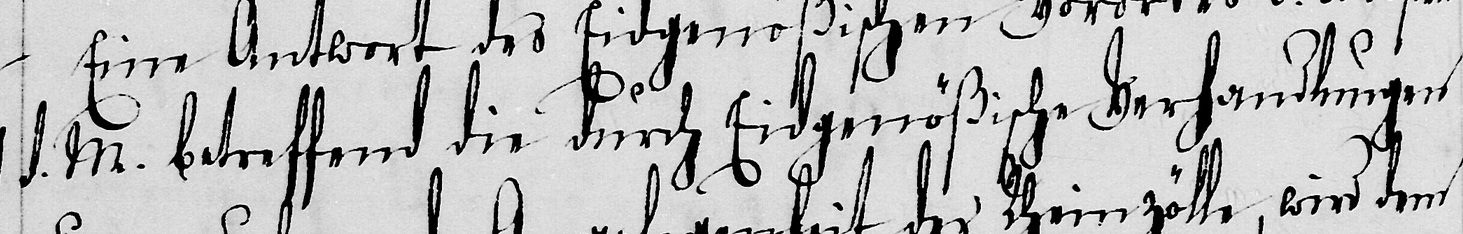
d. M. betreffend die durch Eidgenößische Verhandlungen
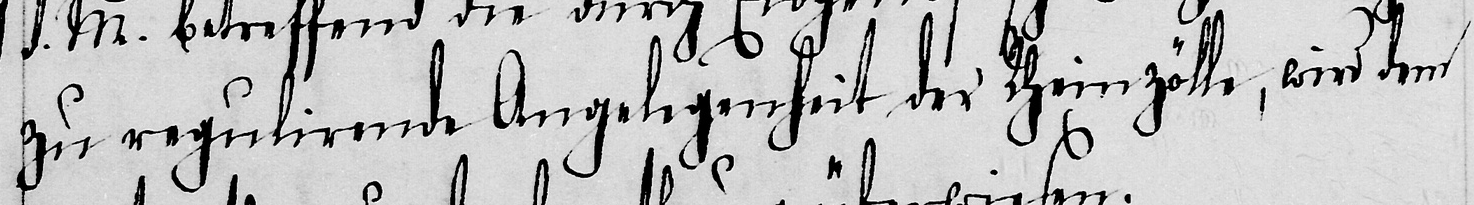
zu regulirende Angelegenheit der Rheinzölle, wird dem
